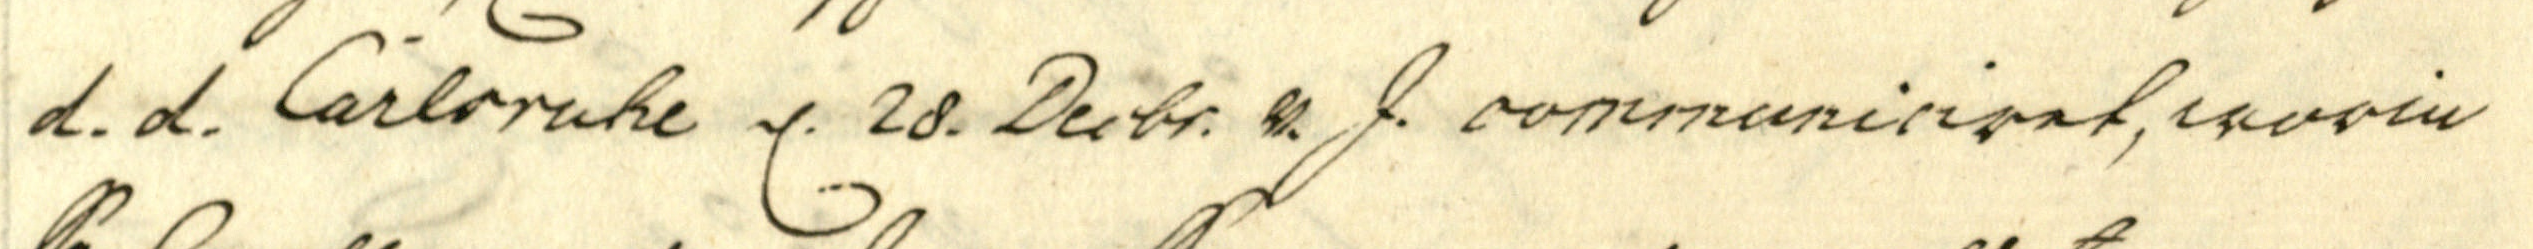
d. d. Carlsruhe d. 28. Decbr. v. J. communiciret, worin
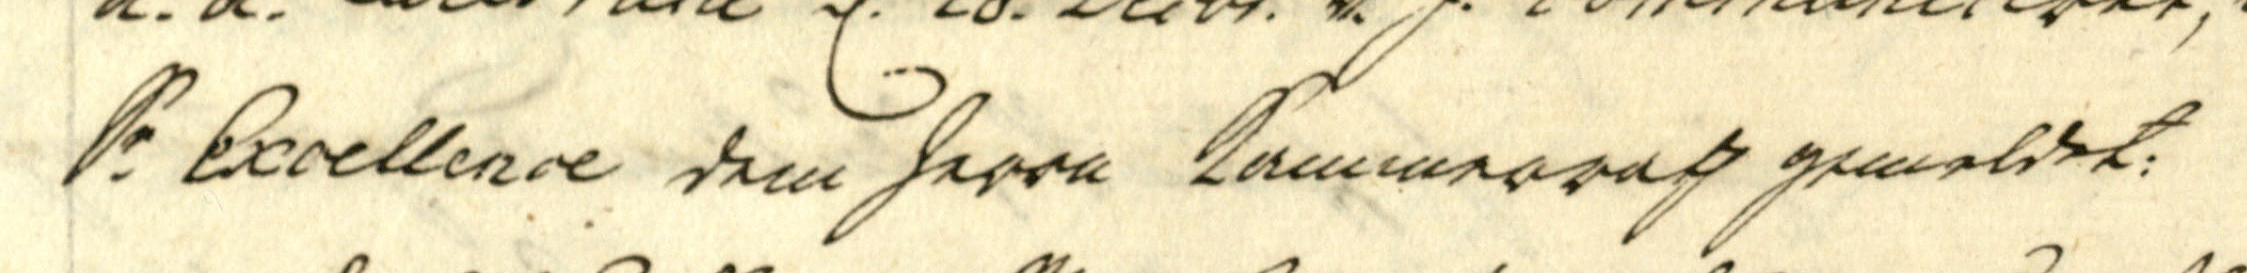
Sr Excellence dem Herrn Kammerrath gemeldet:
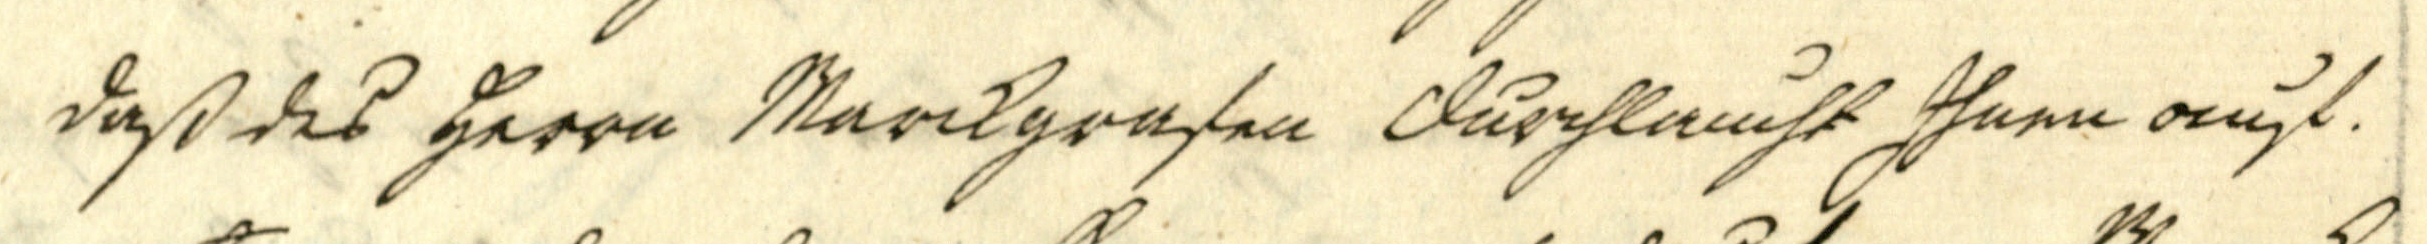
daß des Herrn Marckgrafen Durchlaucht Ihnen auf¬
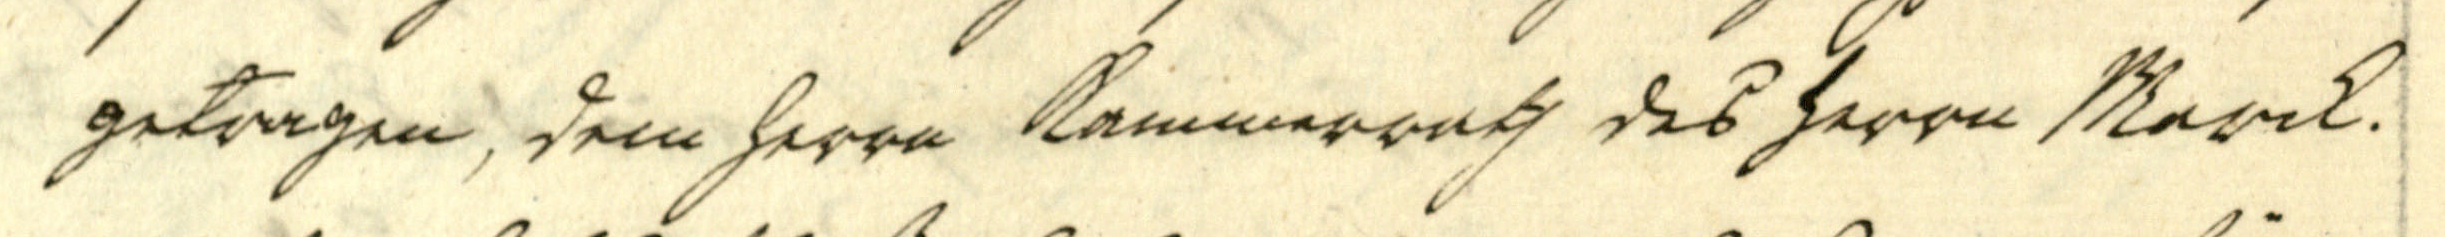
getragen, dem Herrn Kammerrath des Herrn Marck¬
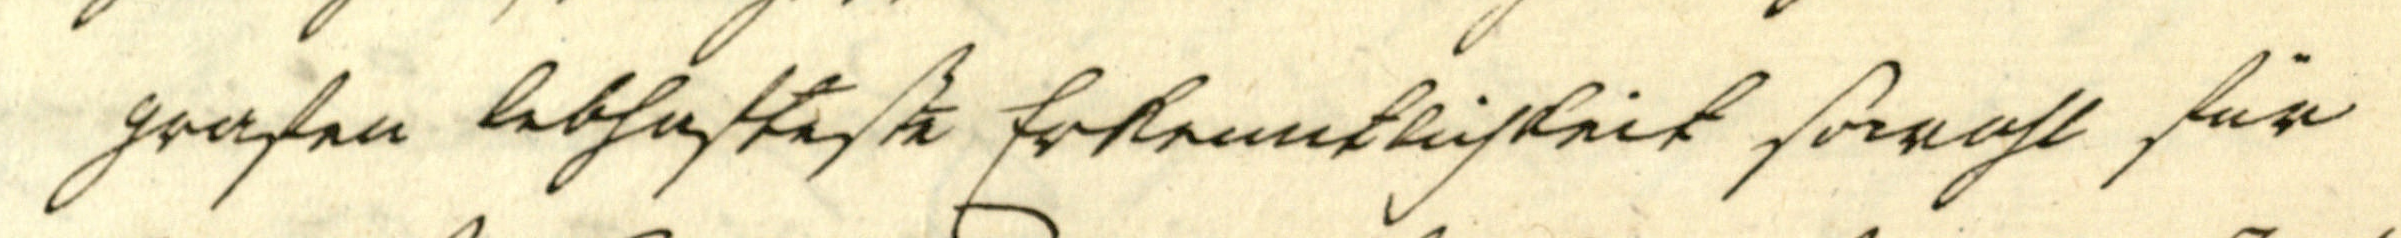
grafen lebhafteste Erkenntlichkeit sowohl für
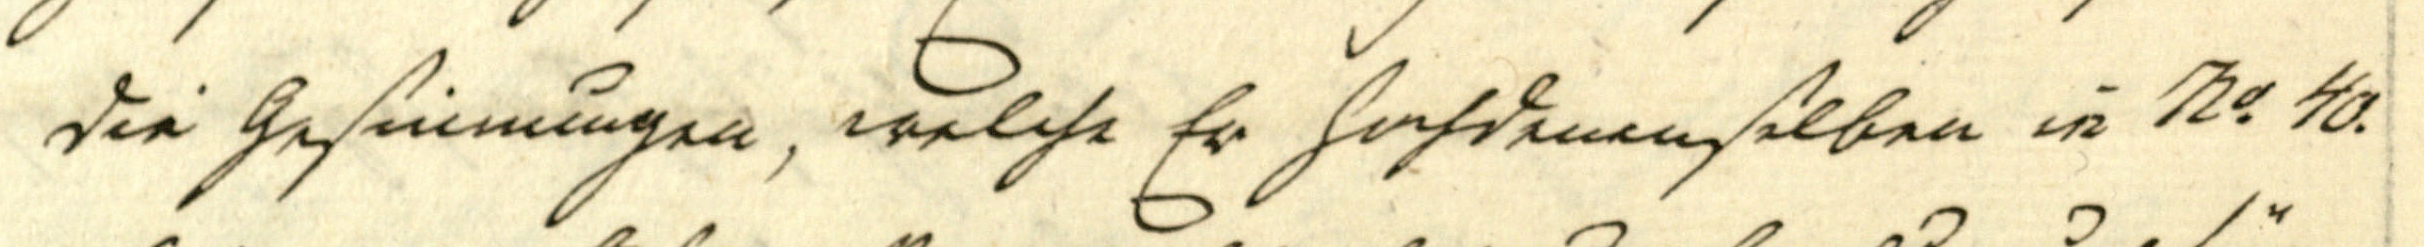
die Gesinnungen, welche Er Hochdenenselben in No 40.
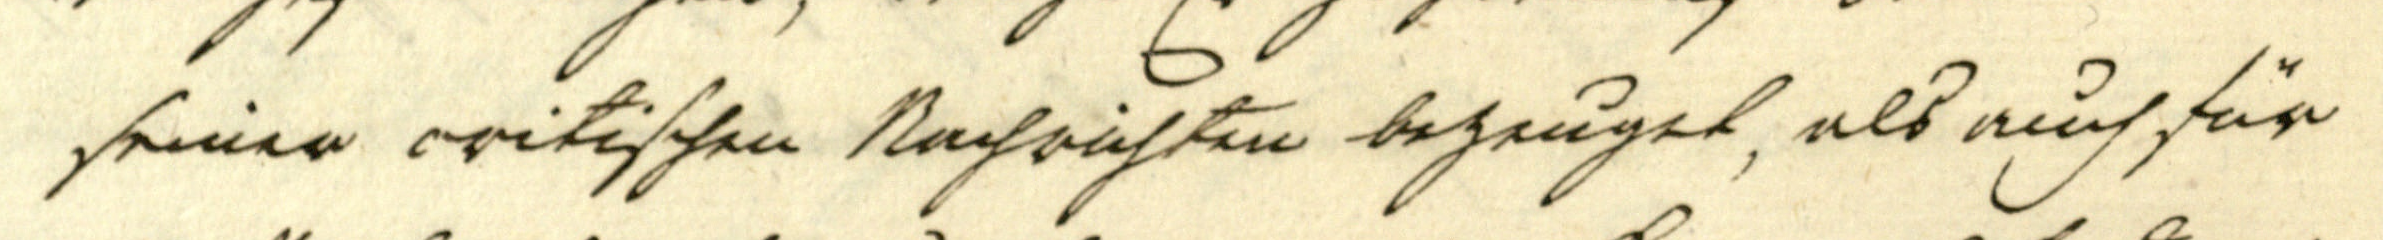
seiner critischen Nachrichten bezeuget, als auch für
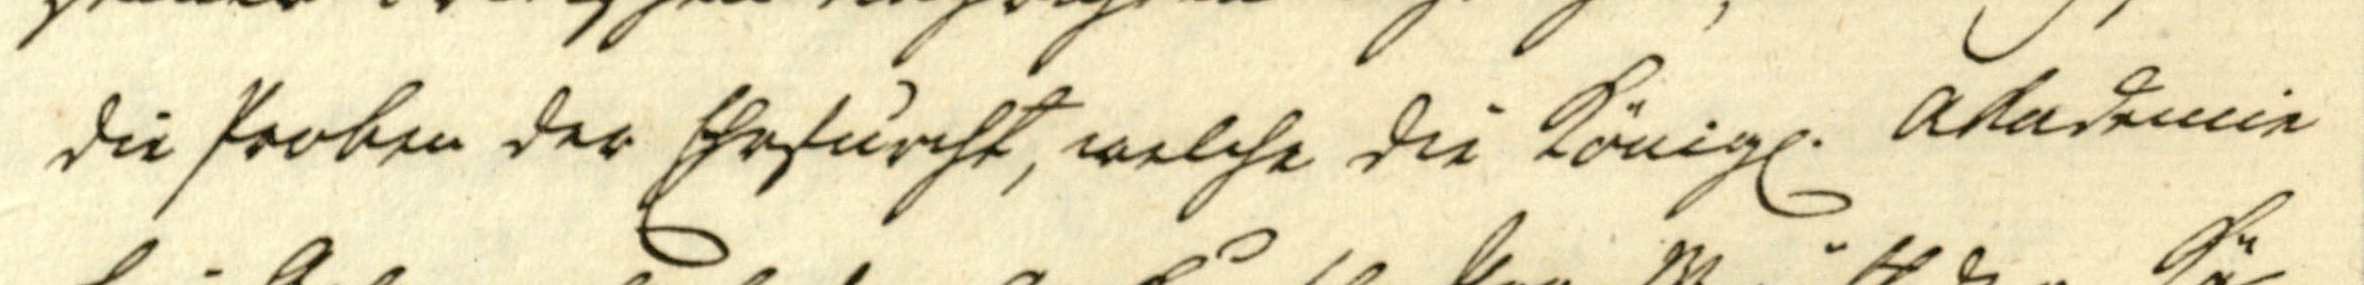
die Proben der Ehrfurcht, welche die Königl. Akademie
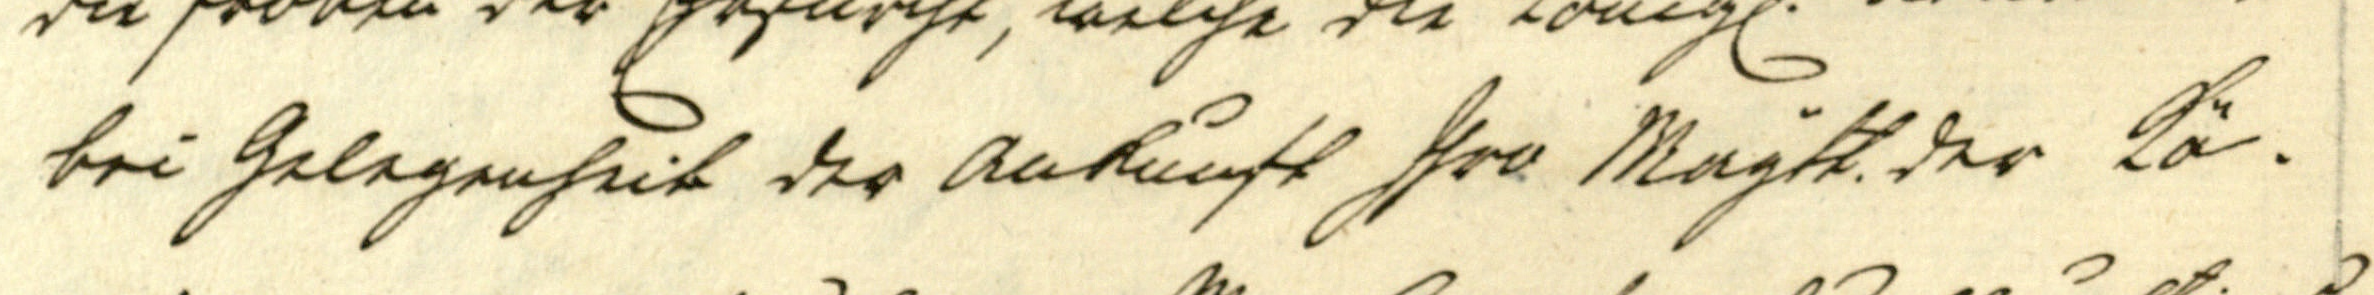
bei Gelegenheit der Ankunft Ihro Maÿtt der Kö¬
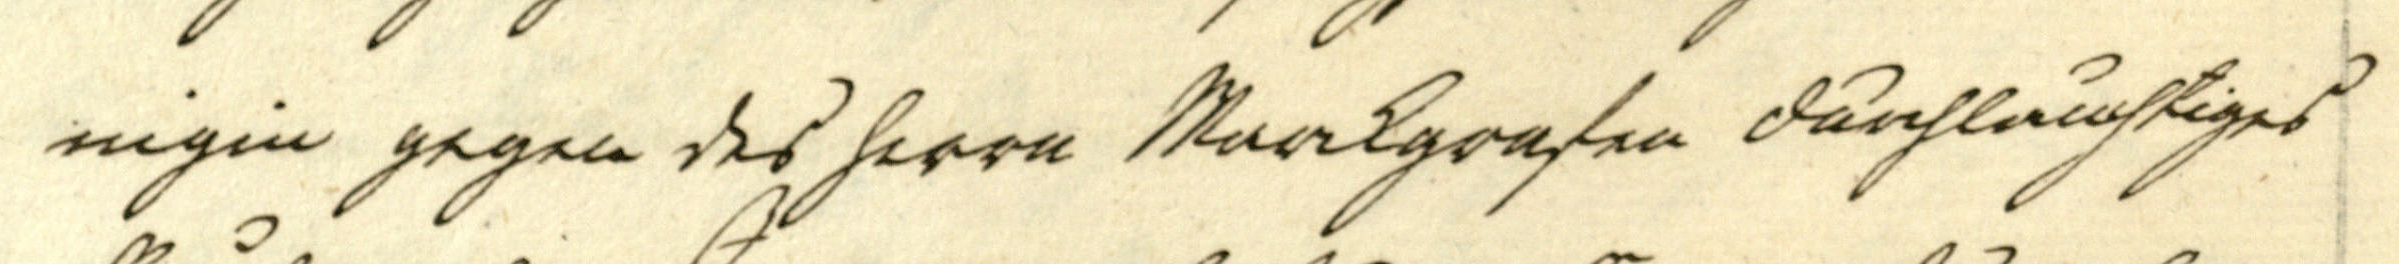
nigin gegen des Herrn Marckgrafen Durchlauchtiges
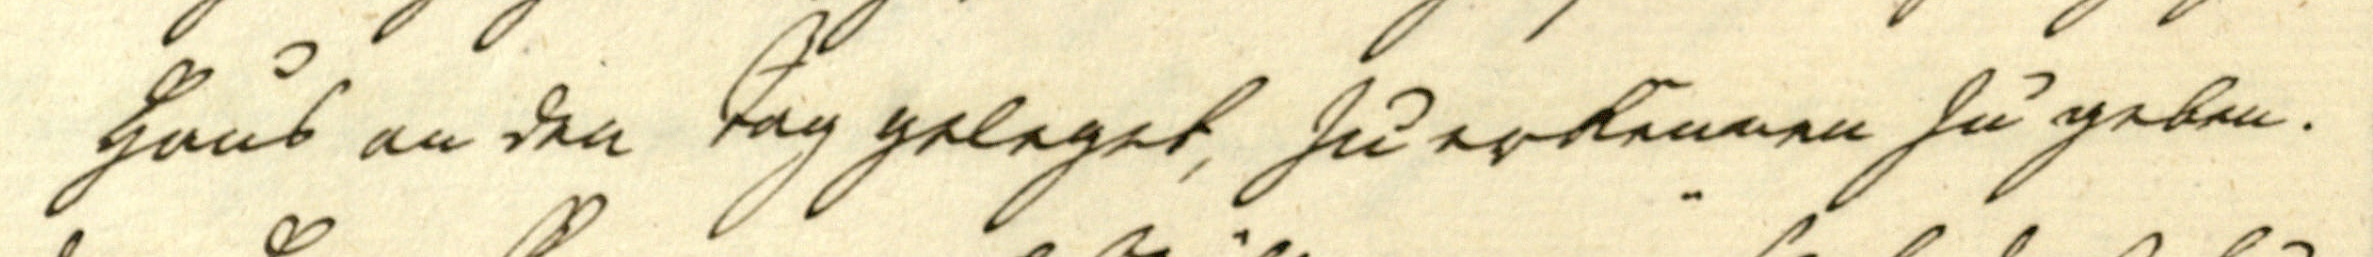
Haus an den Tag geleget, zu erkennen zu geben.
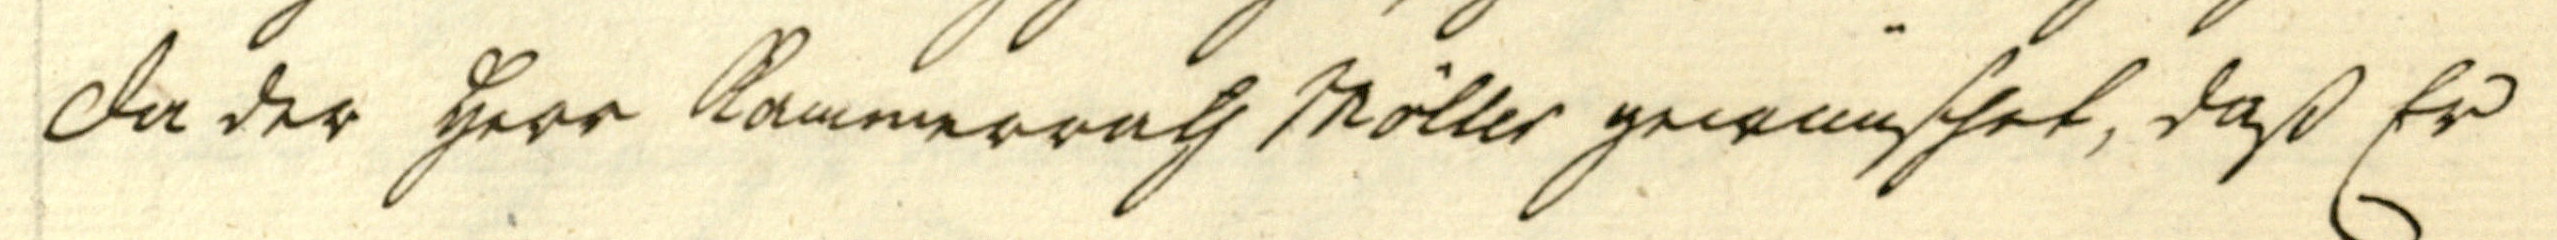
Da der Herr Kammerrath Möller gewünschet, daß Er
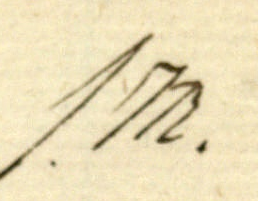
sm.
